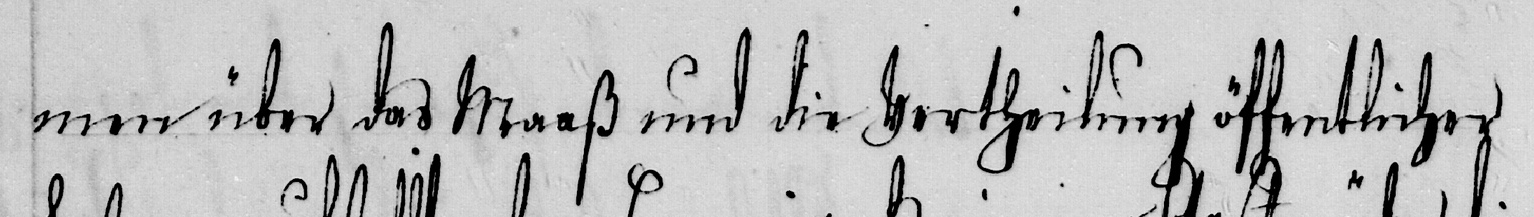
men über das Maaß und die Vertheilung öffentlicher
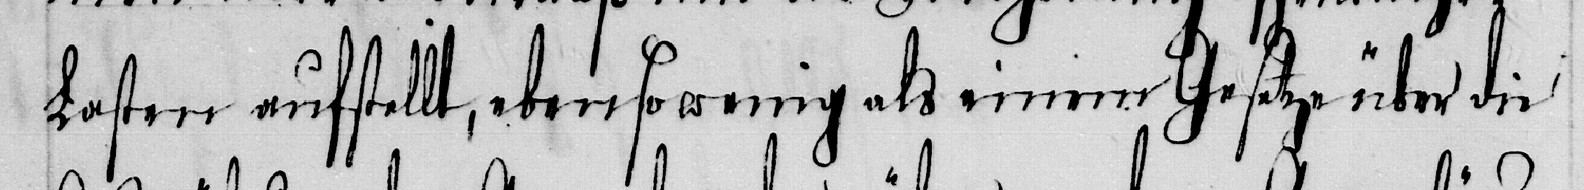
Lasten aufstellt, ebenso wenig als einem Gesetze über die
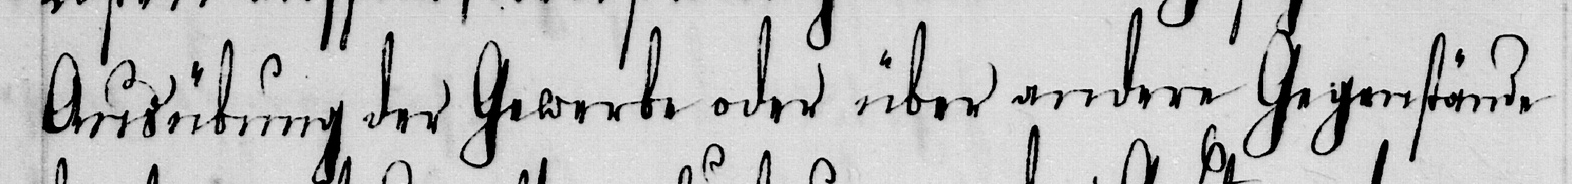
Ausübung der Gewerbe oder über andere Gegenstände
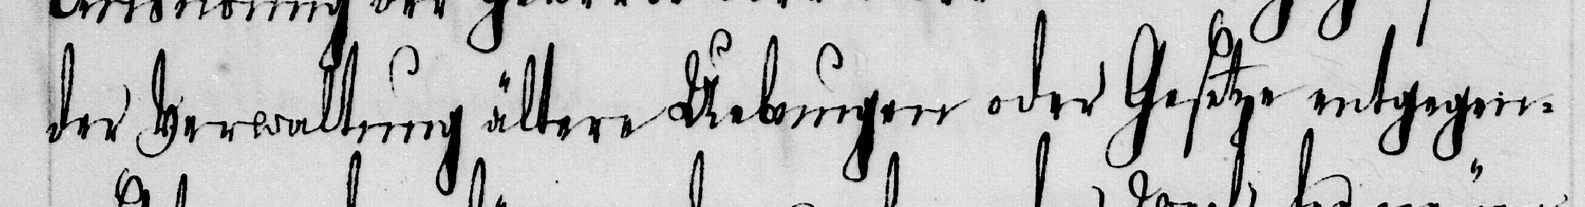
der Verwaltung ältere Uebungen oder Gesetze entgegen¬
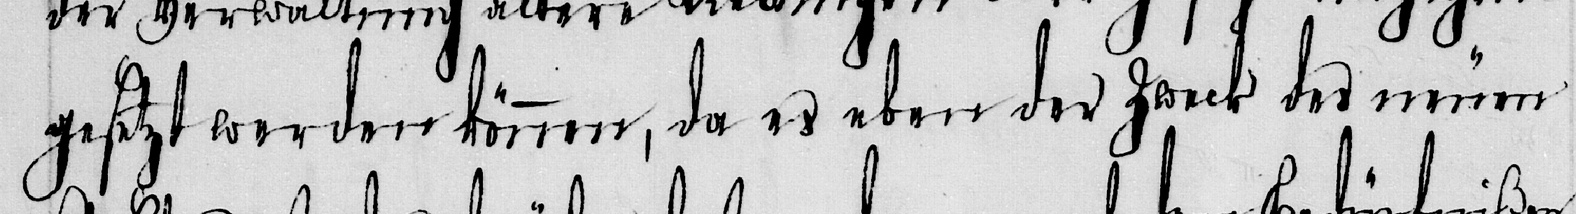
gesetzt werden können, da es eben der Zweck des neuen
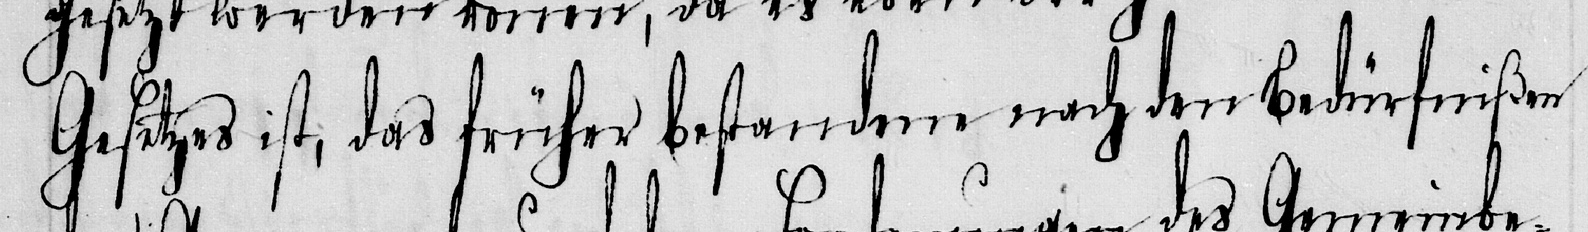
Gesetzes ist, das früher bestandene nach den Bedürfnißen
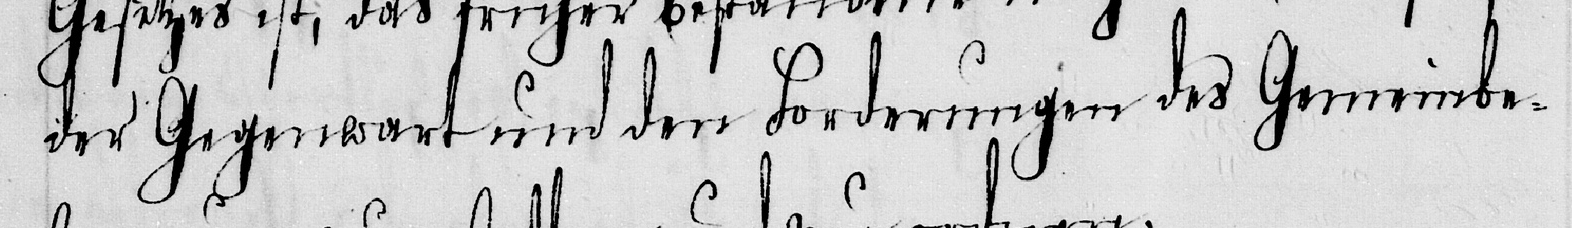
der Gegenwart und den Forderungen des Gemeinbe¬
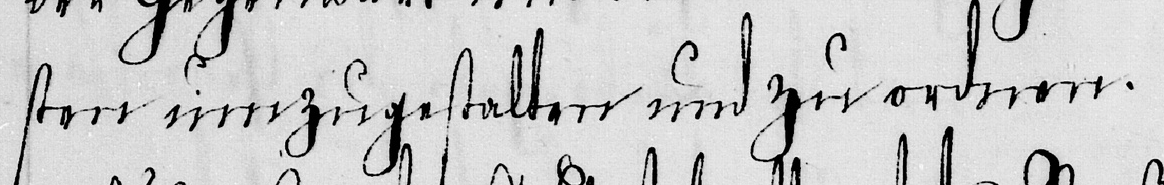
sten umzugestalten und zu ordnen.
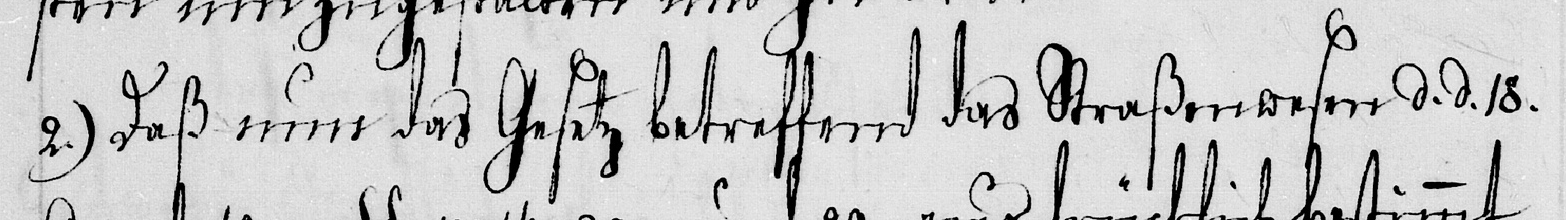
2.) Daß um das Gesetz betreffend das Straßenwesen d. d.
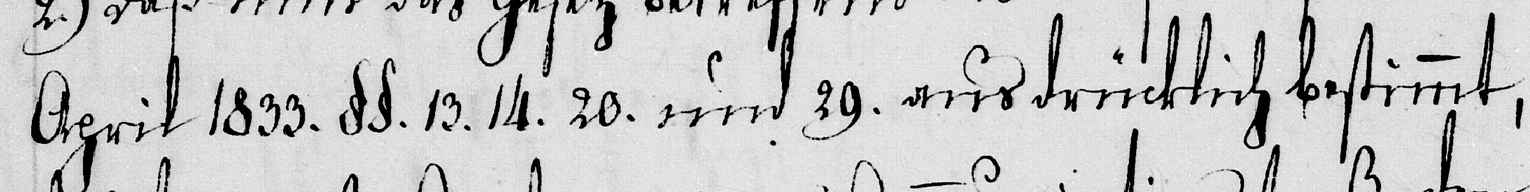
April 1833. §§. 13. 14. 20. und 29. ausdrücklich bestimmt,
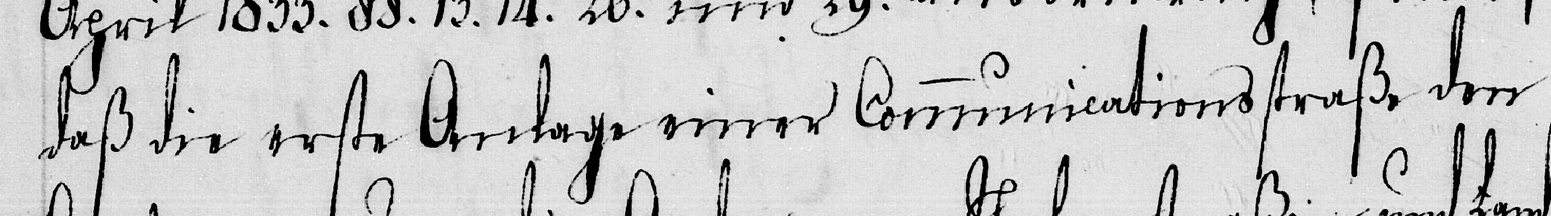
daß die erste Anlage einer Communicationsstraße den
